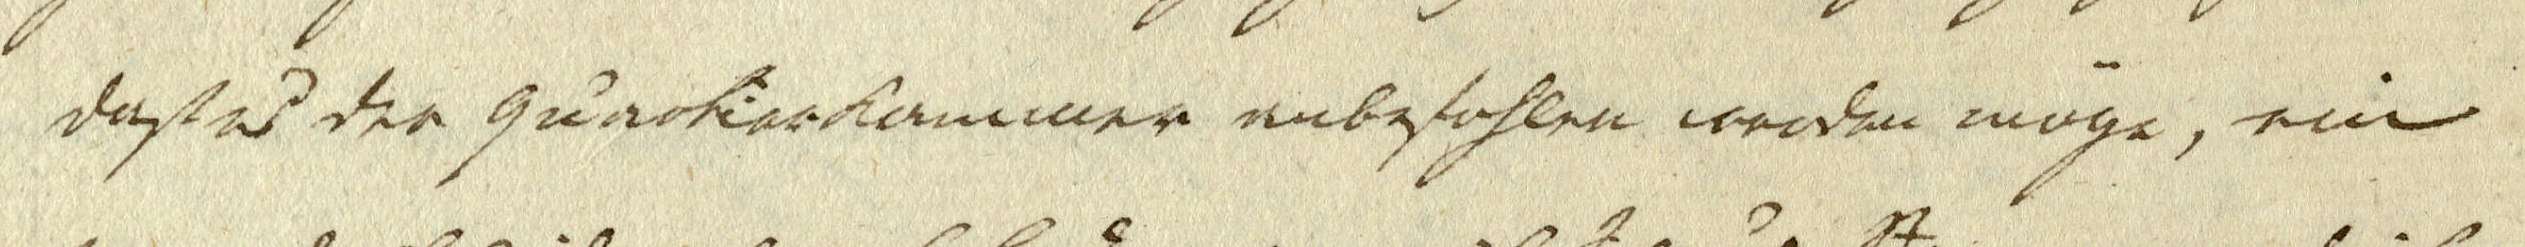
daß es der Quartierkammer anbefohlen werden möge, ein
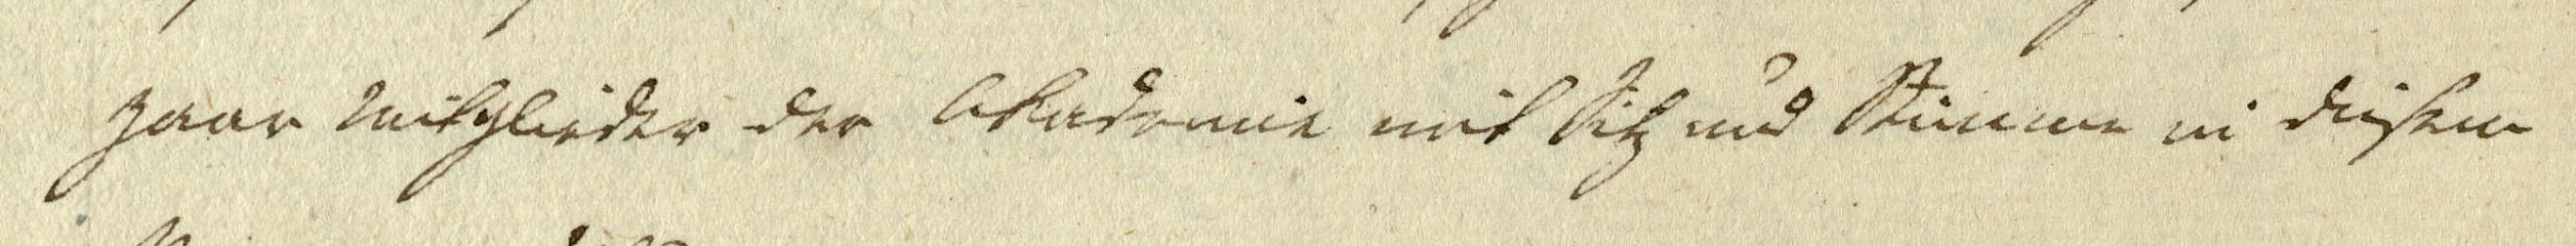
paar Mitglieder der Akademie mit Sitz und Stimme in diesem
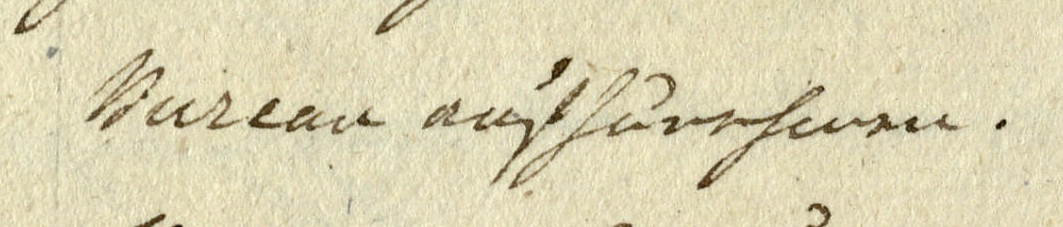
Bureau aufzunehmen.
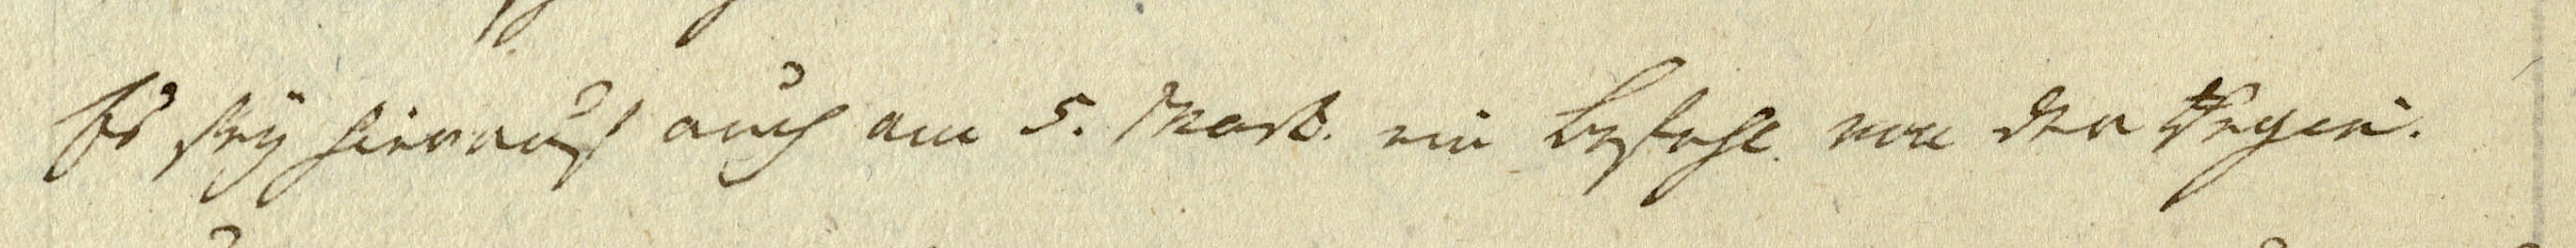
Er seÿ hierauf auch am 5. Mart. ein Befehl von der Regie¬
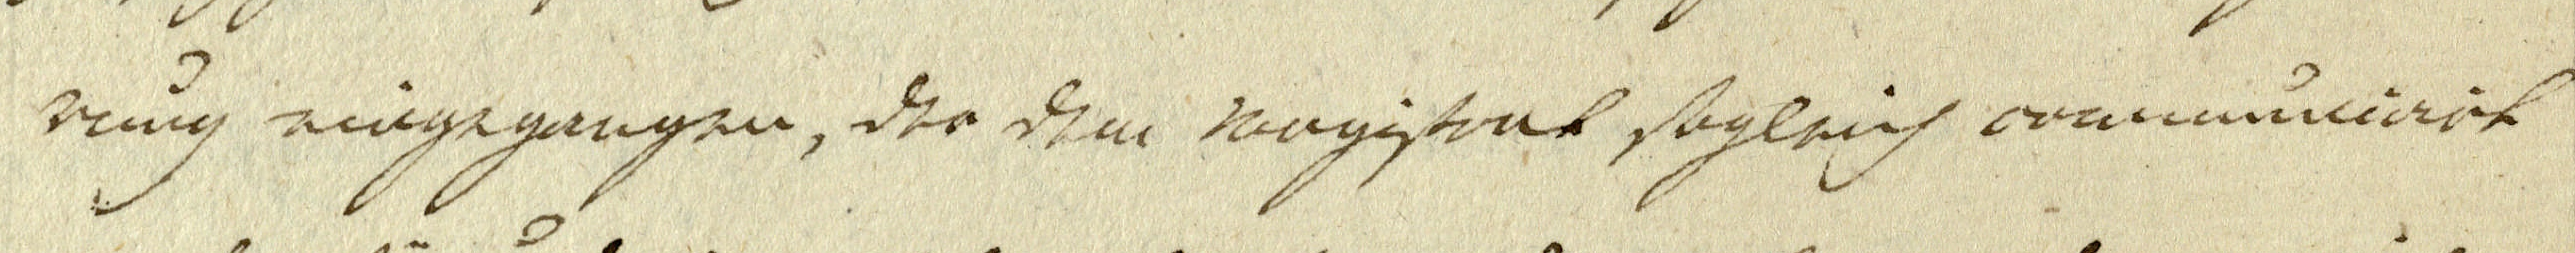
rung eingegangen, der dem Magistrat sogleich communicirt
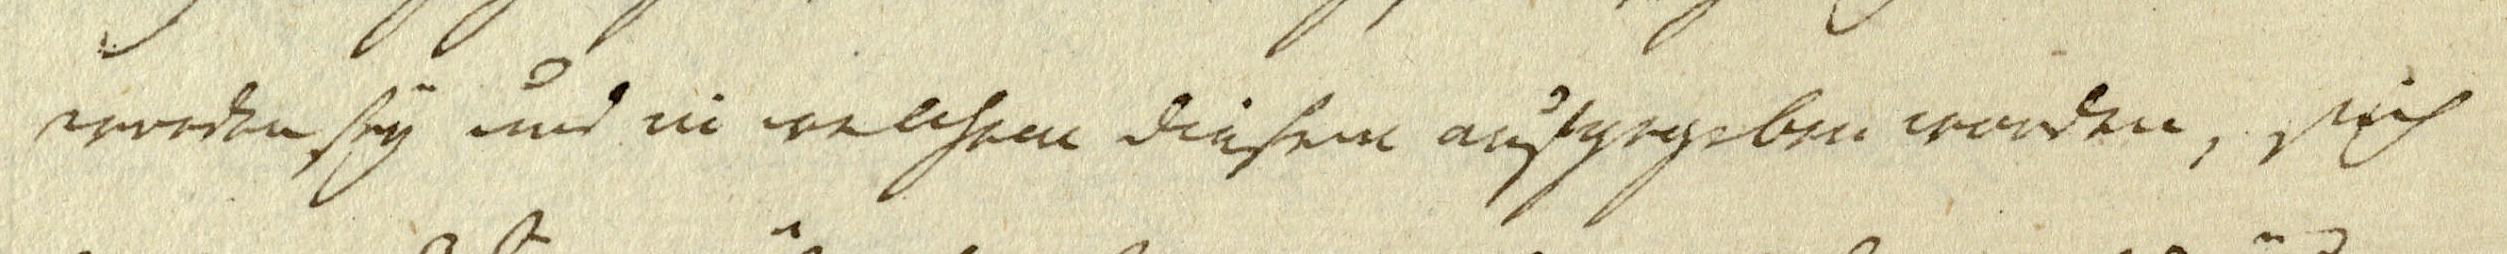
worden seÿ und in welchem diesem aufgegeben worden, sich
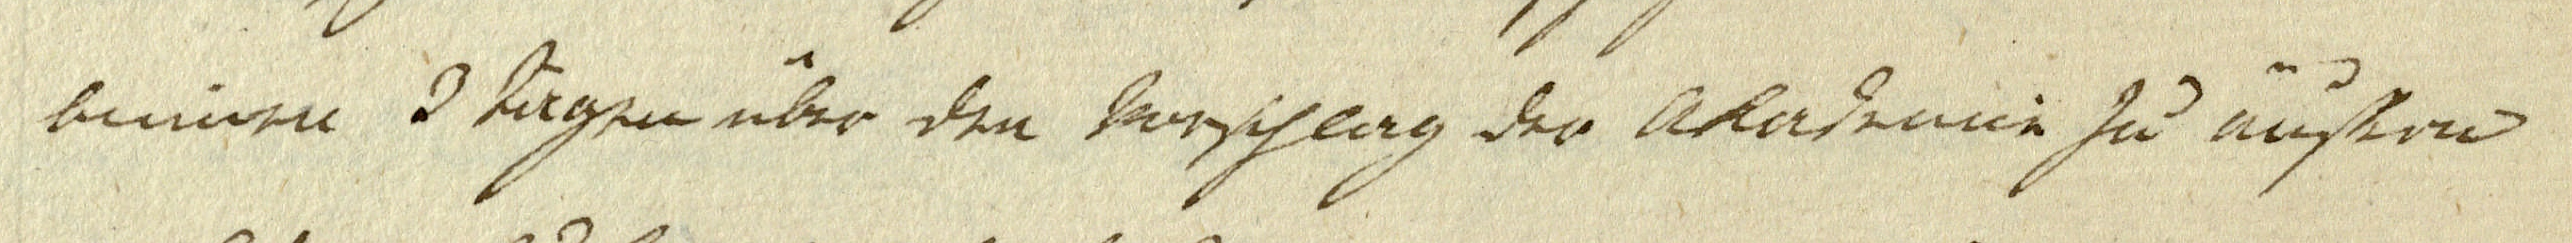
binnen 3 Tagen über den Vorschlag der Akademie zu äussern
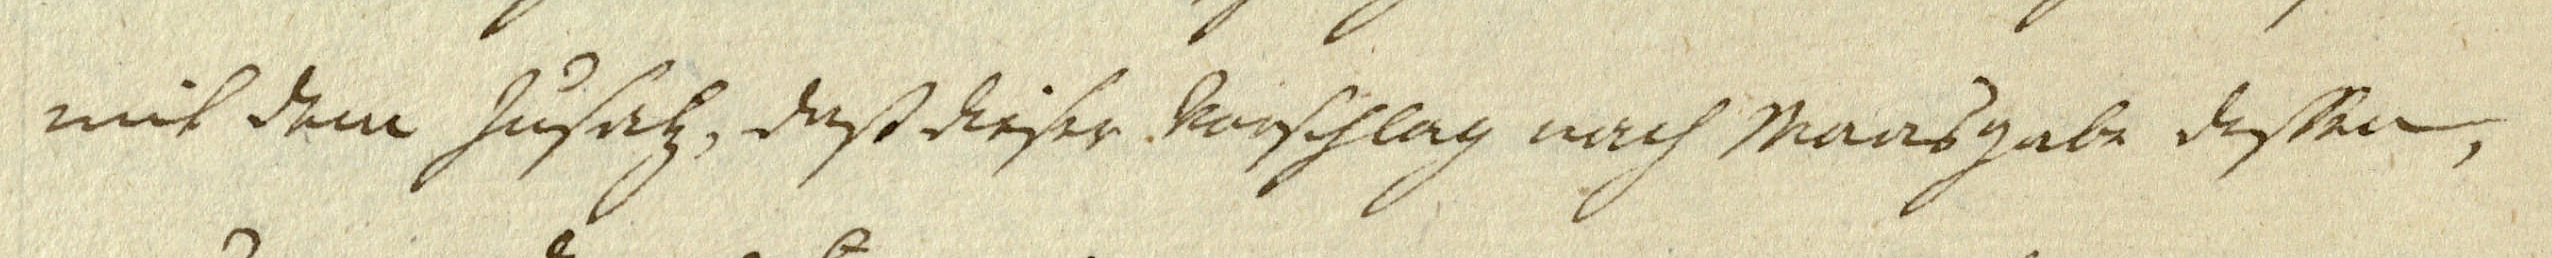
mit dem Zusatz, daß dieser Vorschlag nach Maasgabe dessen,
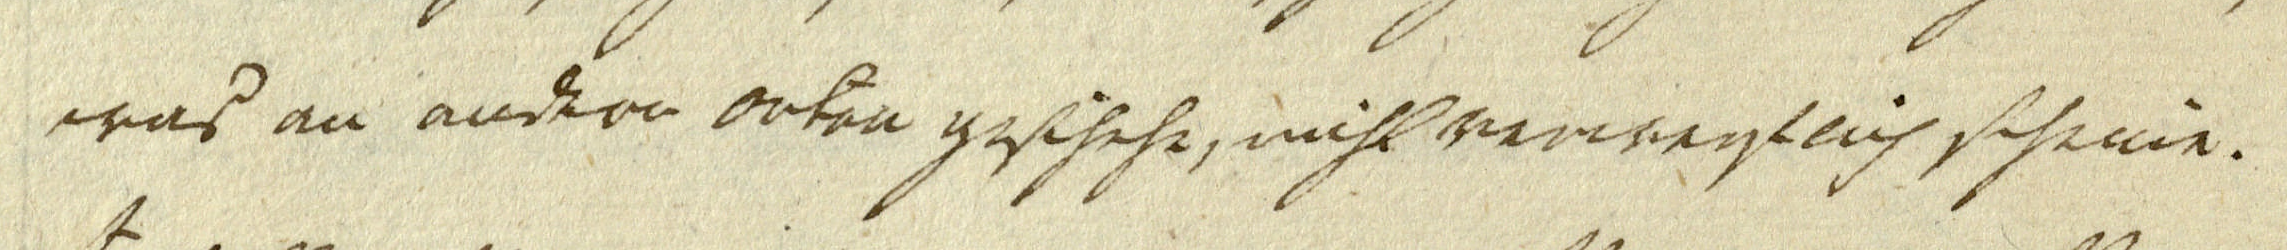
was an andern Orten geschehe, nicht verwerflich scheine.
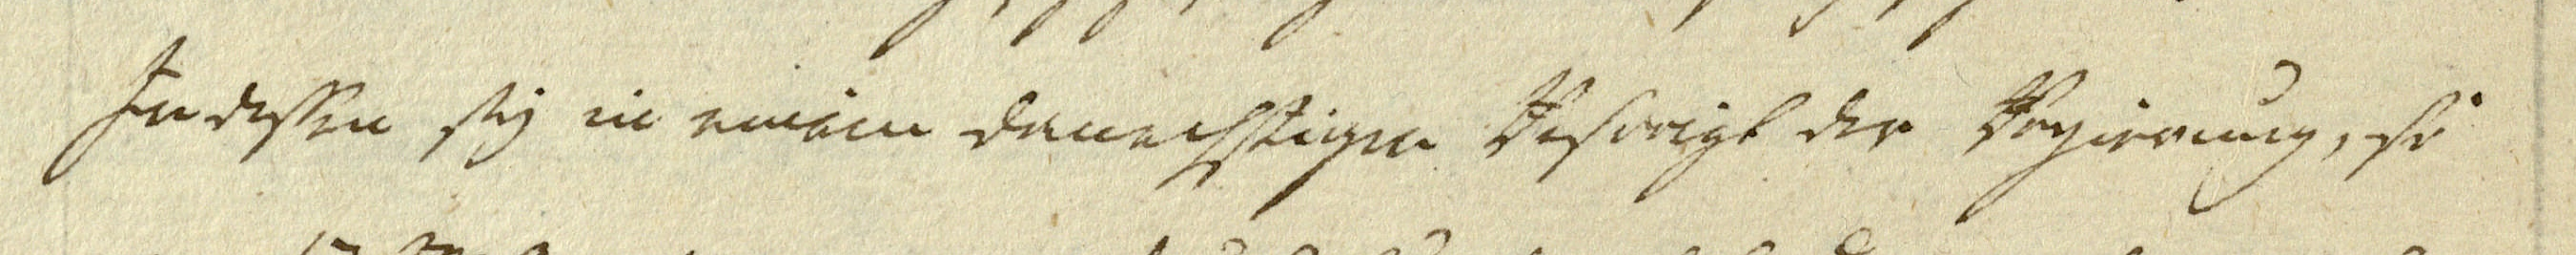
In dessen seÿ in einem danechstigen Rescript der Regierung, so
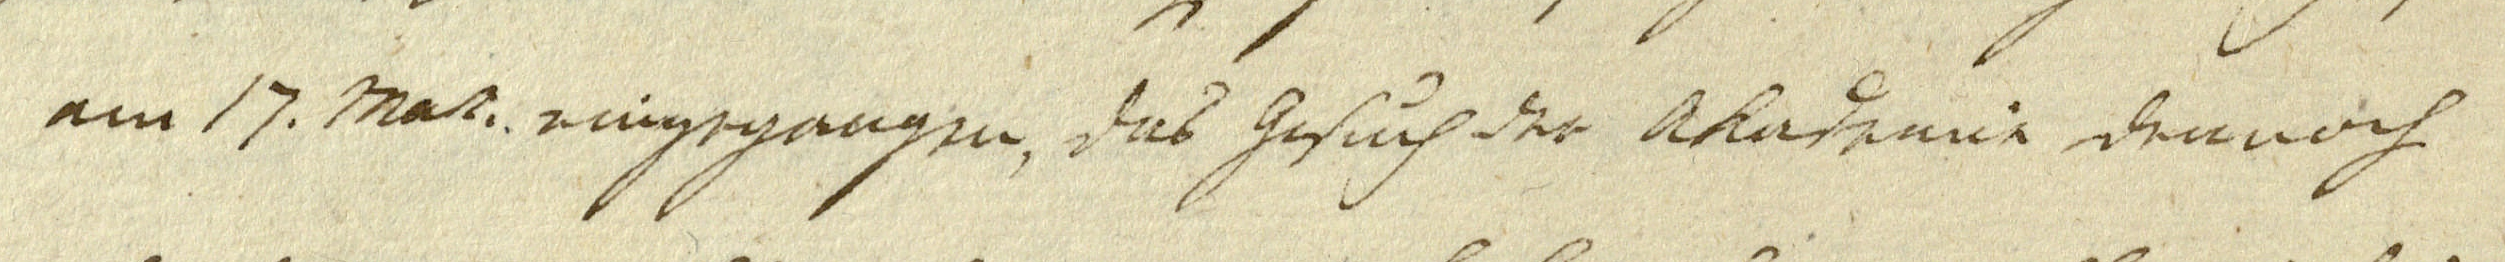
am 17. Mart. eingegangen, das Gesuch der Akademie dennoch
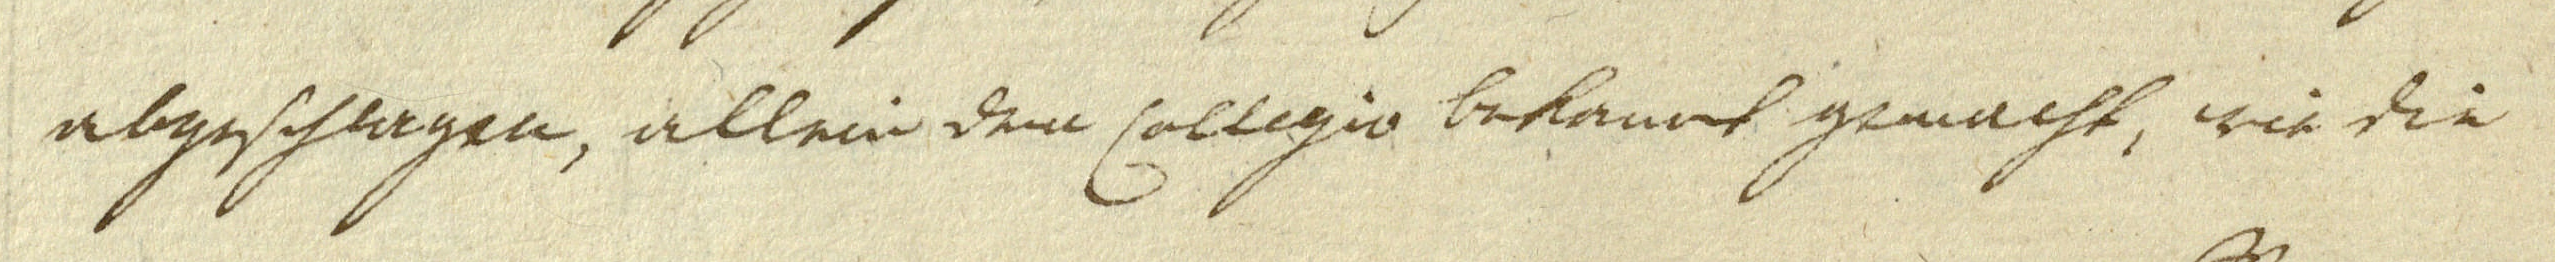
abgeschlagen, allein dem Collegio bekannt gemacht, wie die
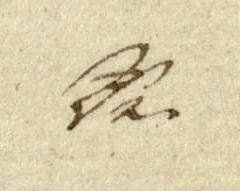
Re.
